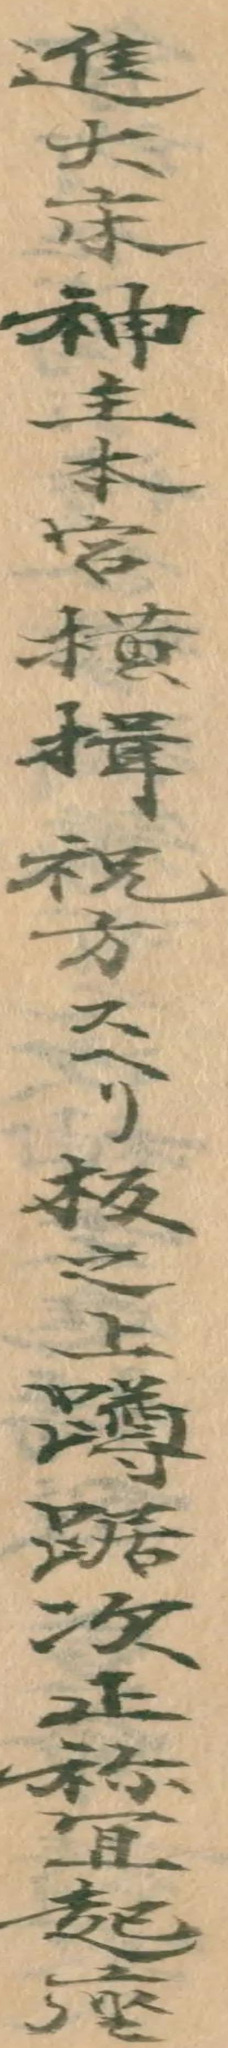進大床神主本宮横揖祝方スヘリ板之上蹲踞次正禰宜起座
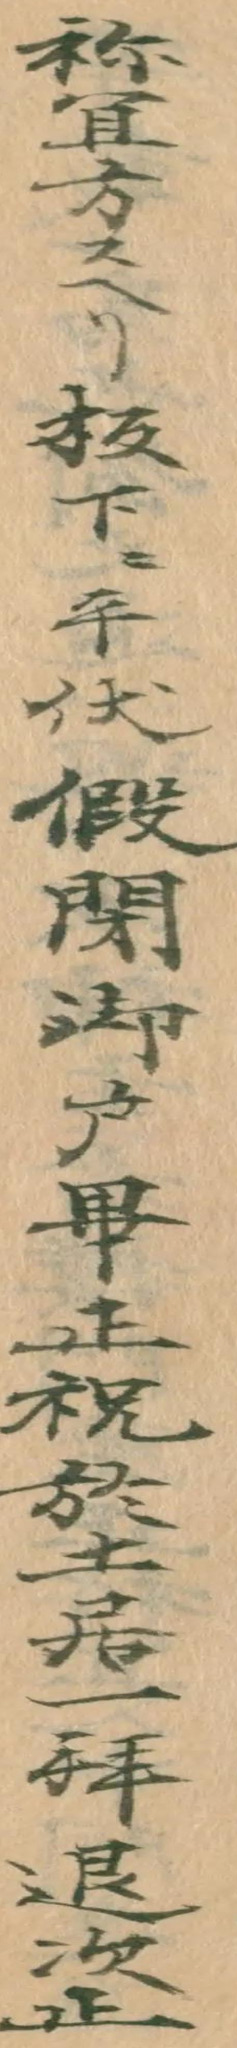禰宜方スヘリ板下ニ平伏仮閉御戸畢正祝於土居一拝退次正
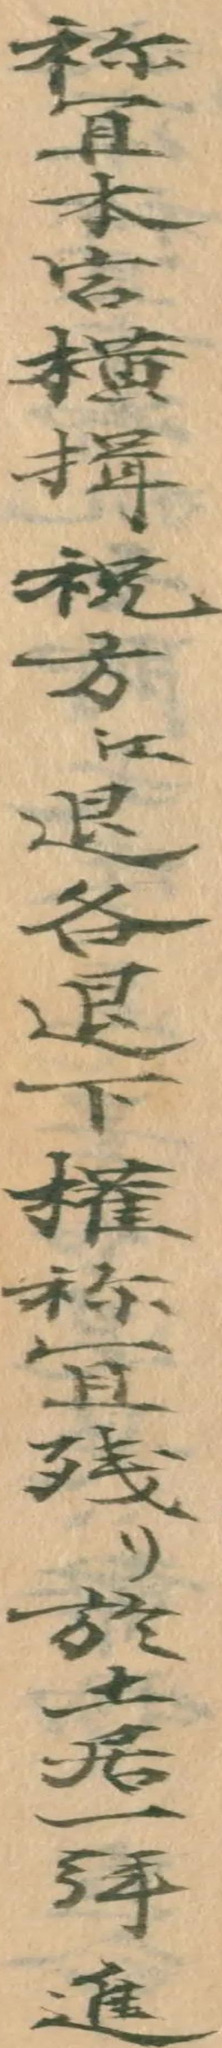禰宜本宮横揖祝方江退各退下権禰宜残リ於土居一拝進

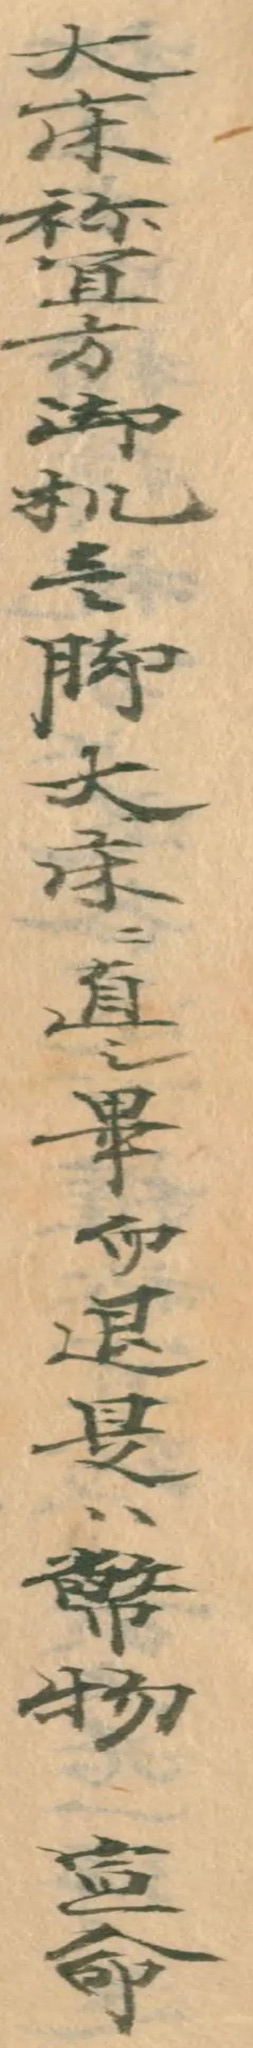大床禰宜方御机壱脚大床ニ直シ畢而退是ハ幣物宣命
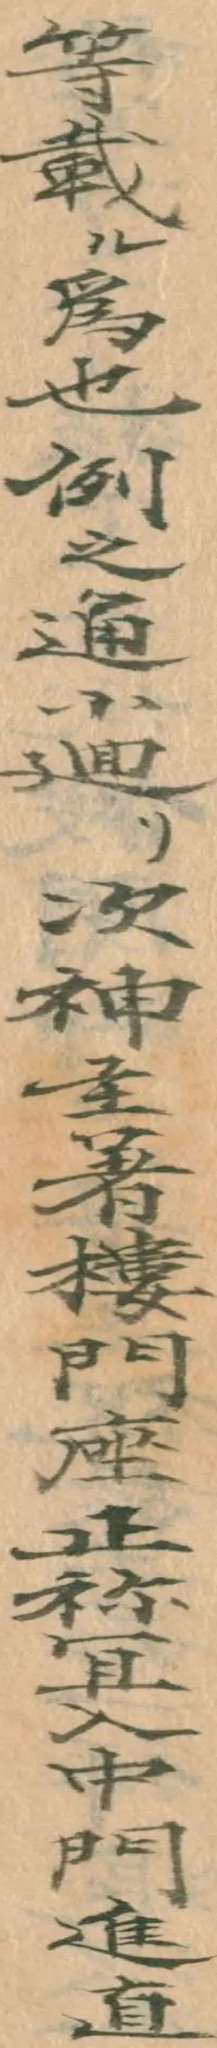等載ル為也例之通小廻リ次神主着楼門座正禰宜入中門進直
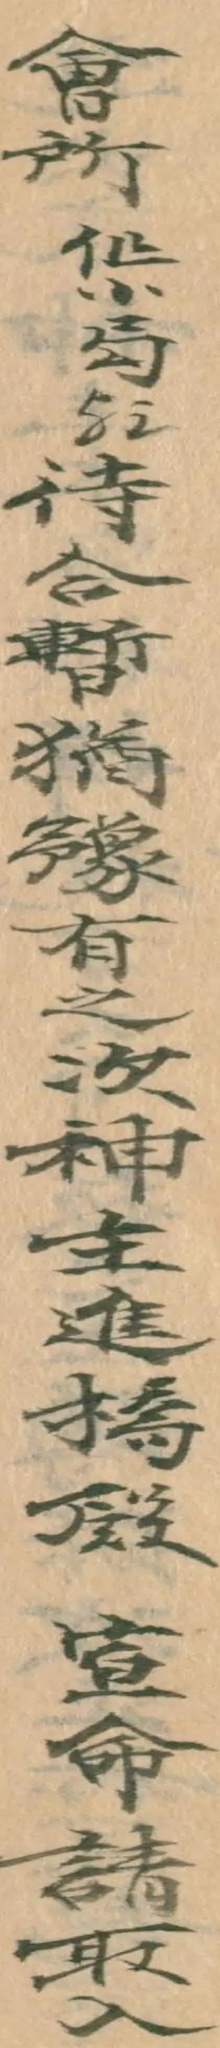会所但小局歟待合暫猶予有之次神主進橋殿宣命請取入
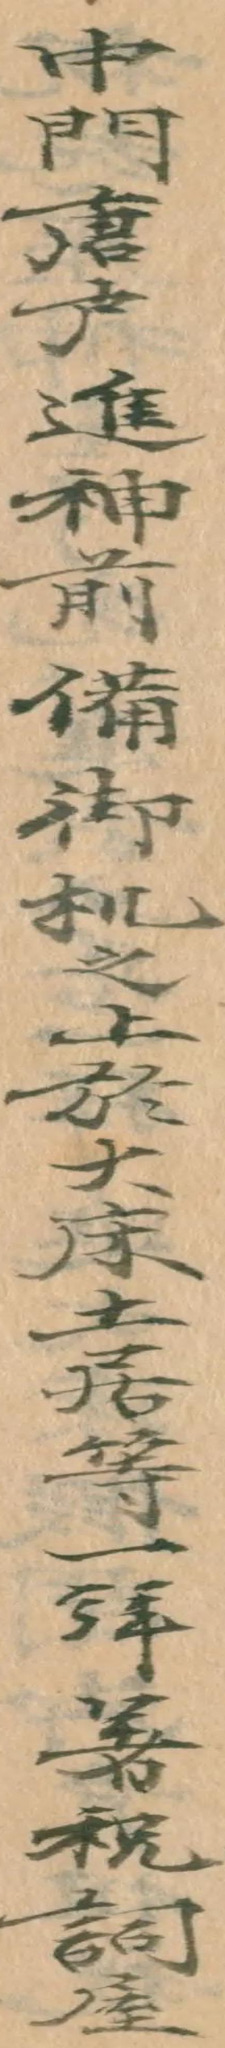中門唐戸進神前備御机之上於大床土居等一拝着祝詞屋
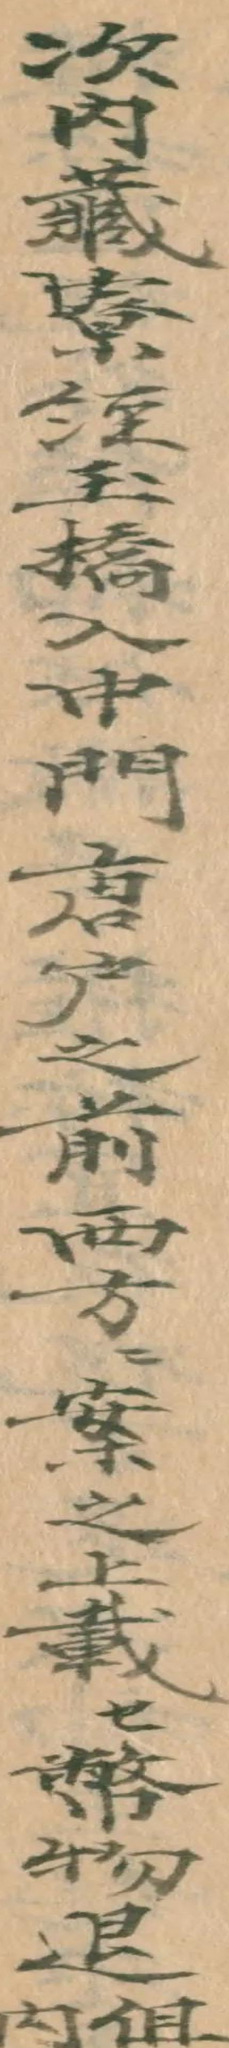次内蔵寮経玉橋入中門唐戸之前西方ニ案之上載セ幣物但内
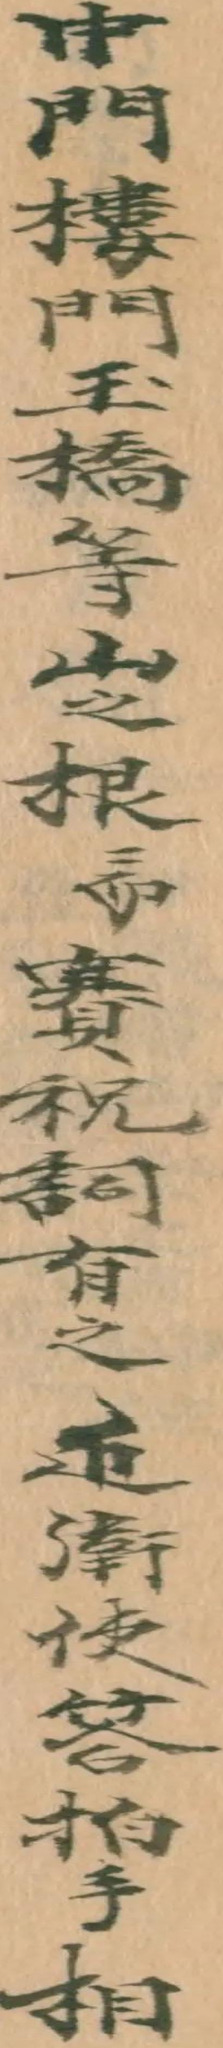中門楼門玉橋等山之根ニ而賽祝詞有之近衛使答拍手相
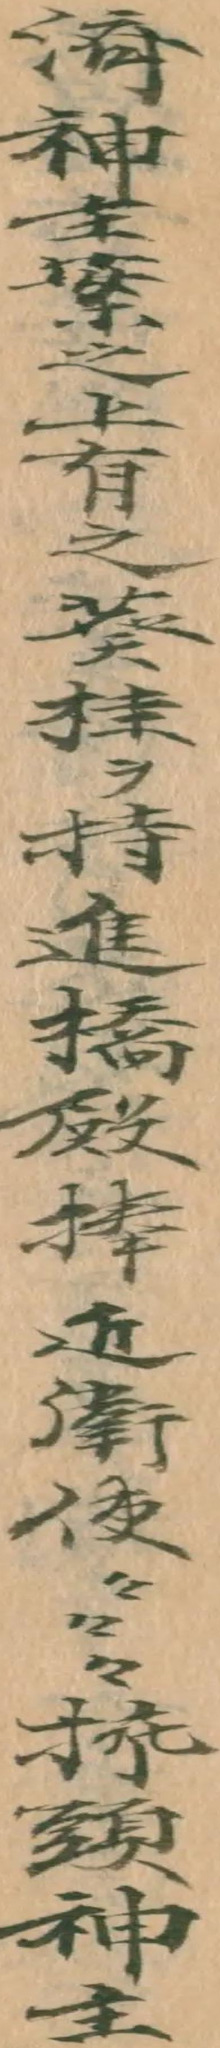済神主案之上有之葵桂ヲ持進橋殿捧近衛使々々々挿頭神主
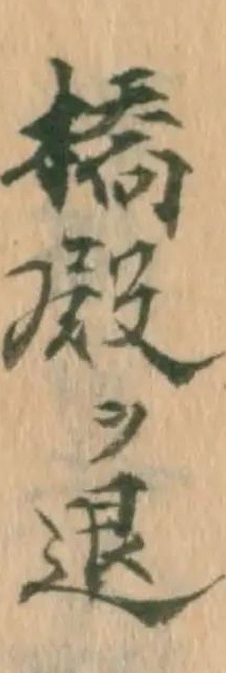橋殿ヲ退
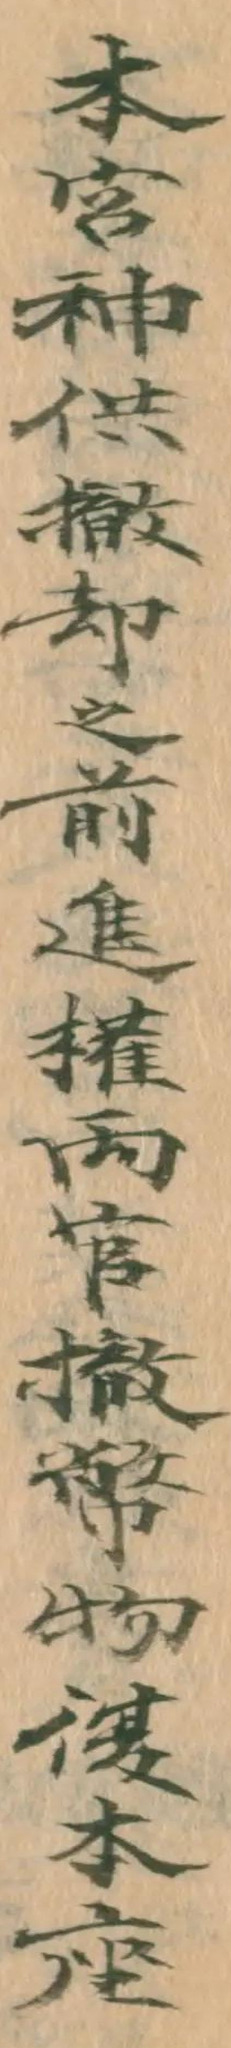本宮神供撤却之前進権両官撤幣物復本座

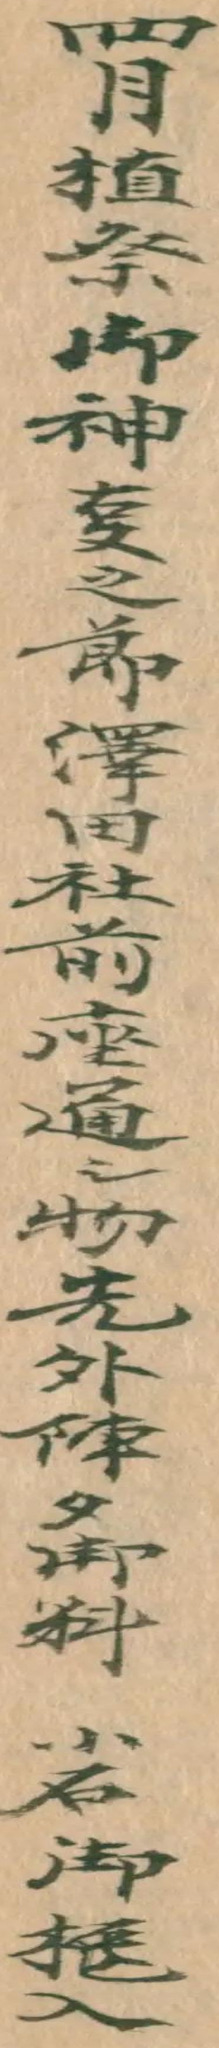四月植祭御神事之節沢田社前座通シ物先外陣夕御料小石御櫃入
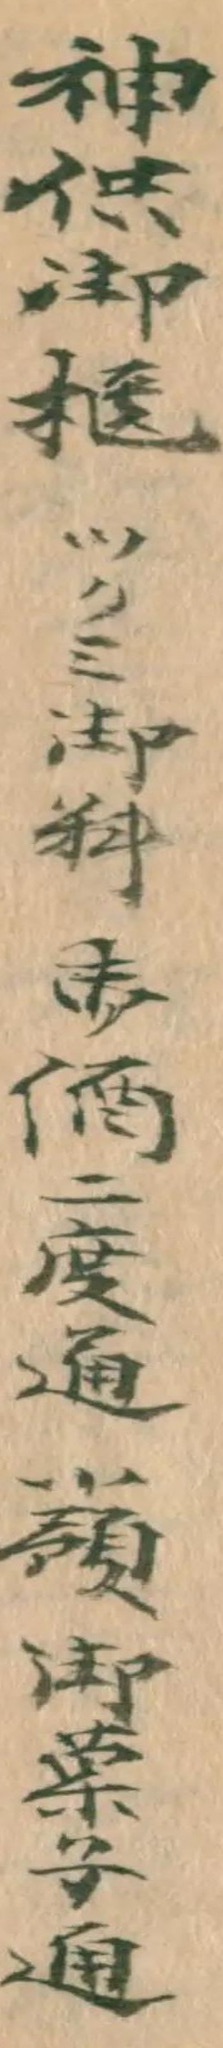神供御櫃ツクミ御料御酒二度通小預御菓子通
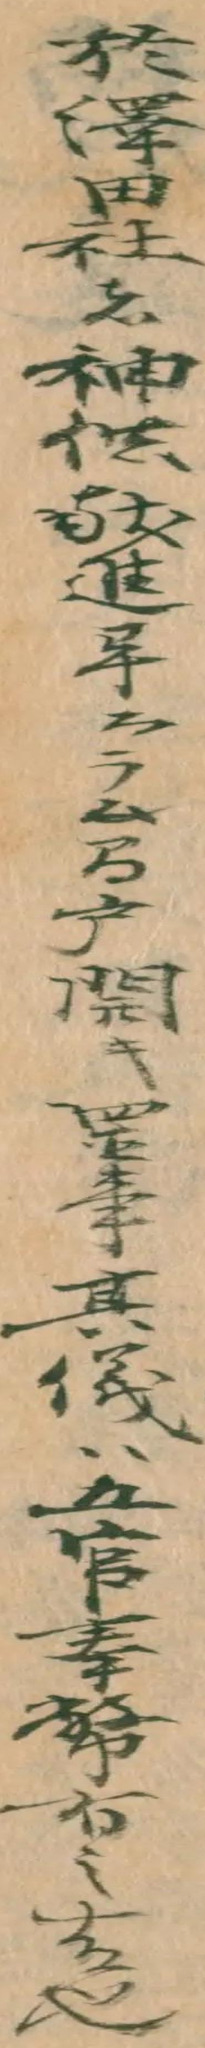於沢田社者神供献進畢而ラム間戸開キ置事其儀ハ五官奉幣有之故也
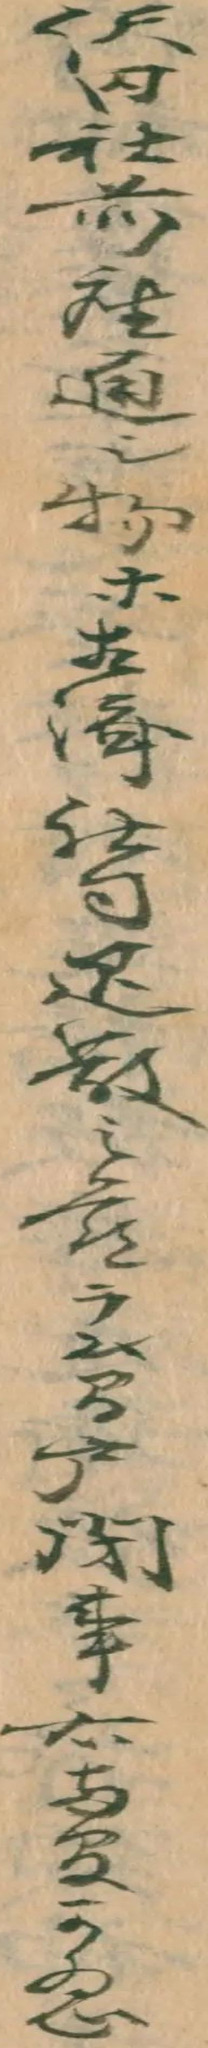沢田社前座通シ物等相済社司退散之節ラム間戸閉事右両官可為心
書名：賀茂社記録. 第5冊
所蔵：国立国会図書館 National Diet Library, JAPAN
